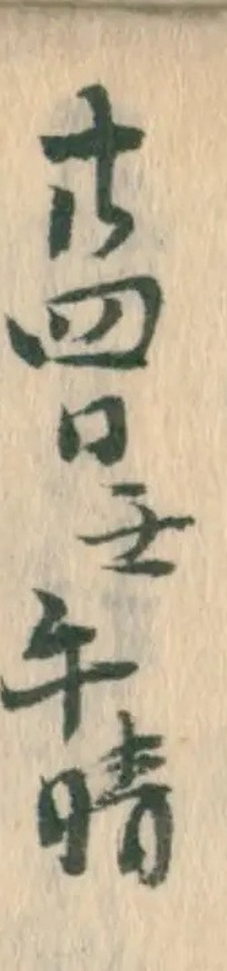廿四日壬午晴
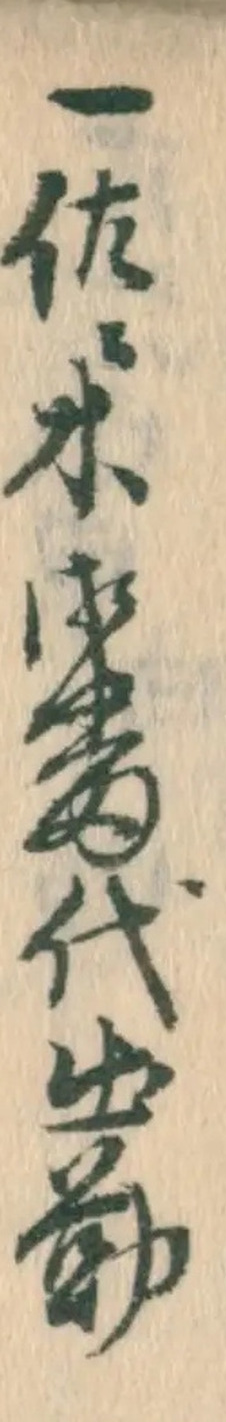一佐々木御番代出勤
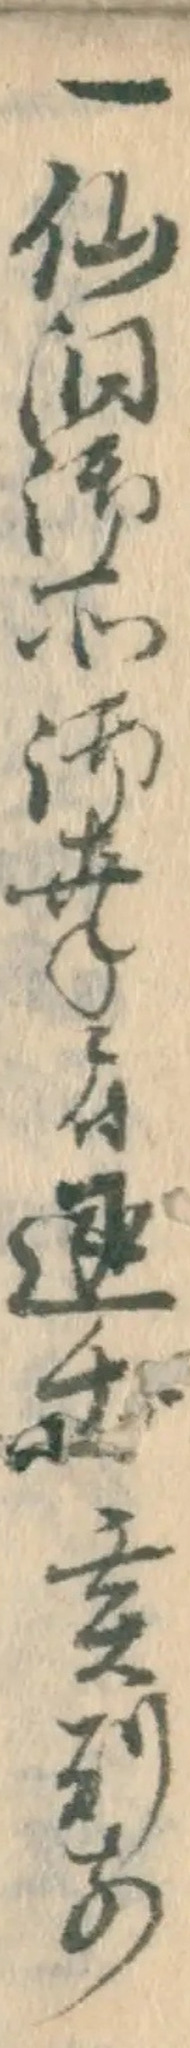一仙洞御所御幸ニ付退出亥刻前

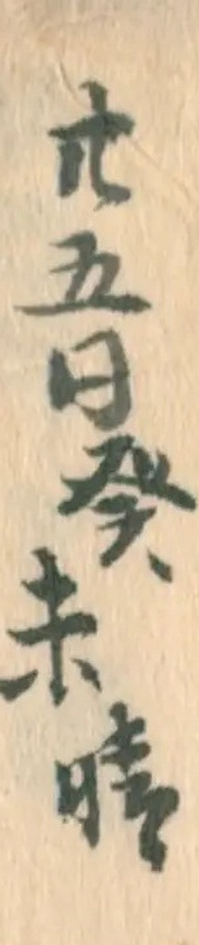廿五日癸未晴
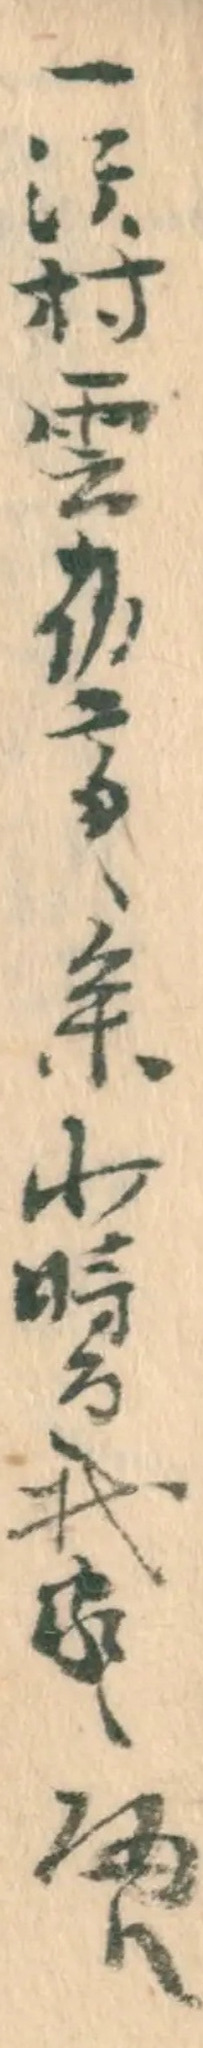一沢村雲州方へ参少時而我家へ帰ル
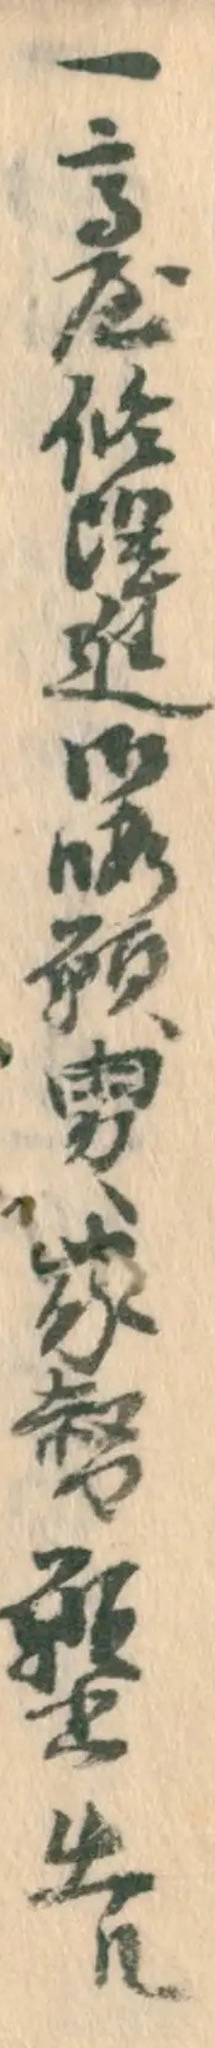一高屋修理進御暇願舅へ家督願書出ル
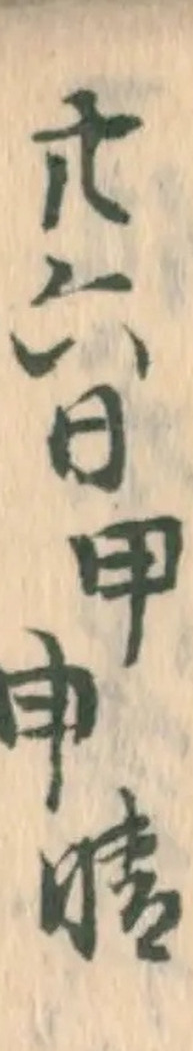廿六日甲申晴
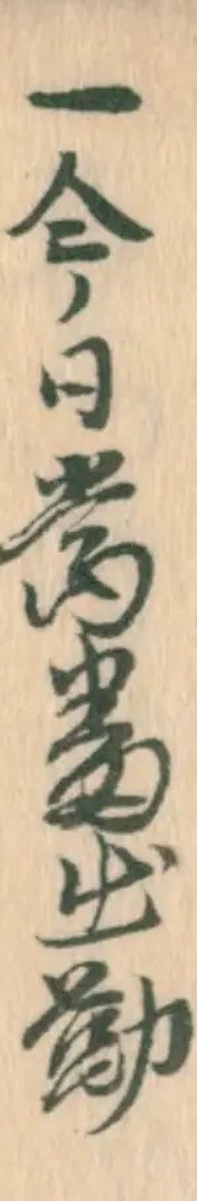一今日当番出勤
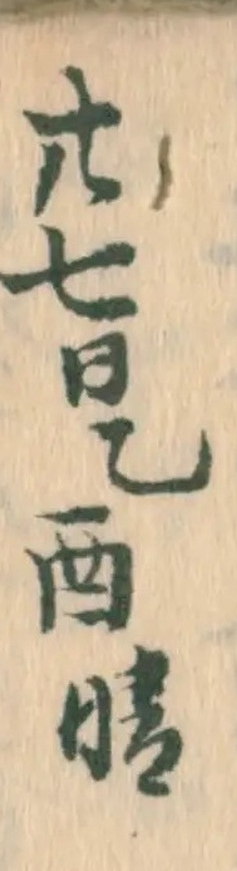廿七日乙酉晴
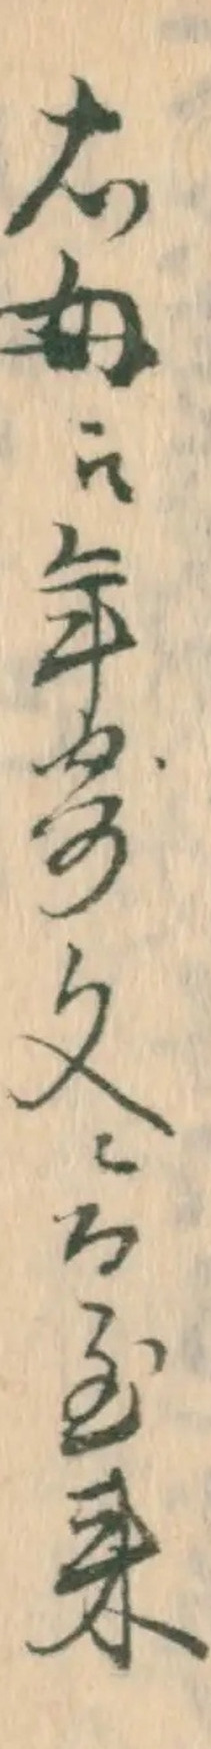右母え年寄文ニ而到来
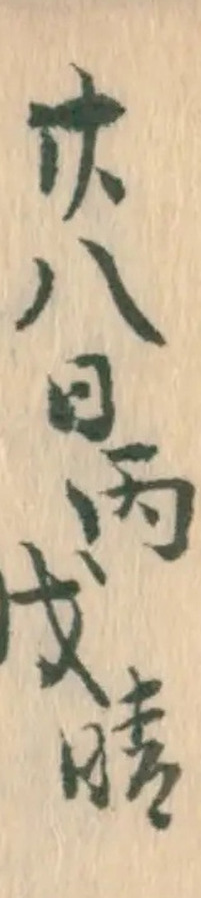廿八日丙戌晴
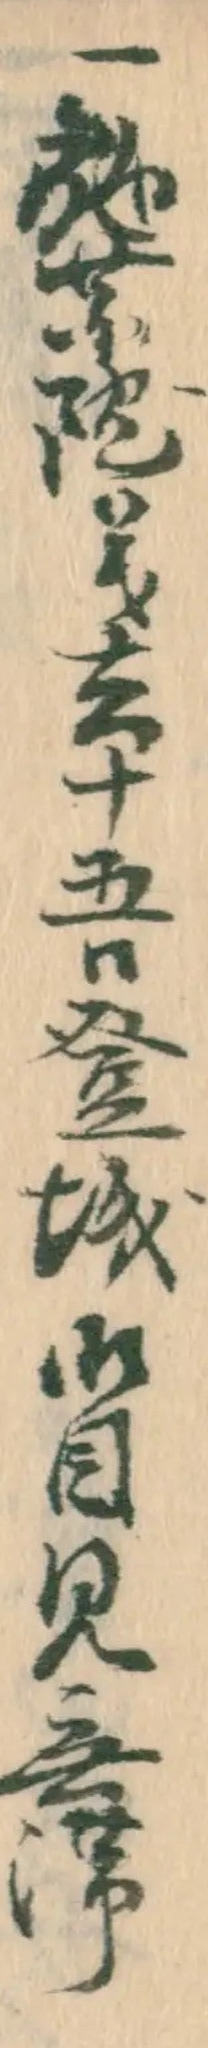一施薬院義去十五日登城御目見無滞
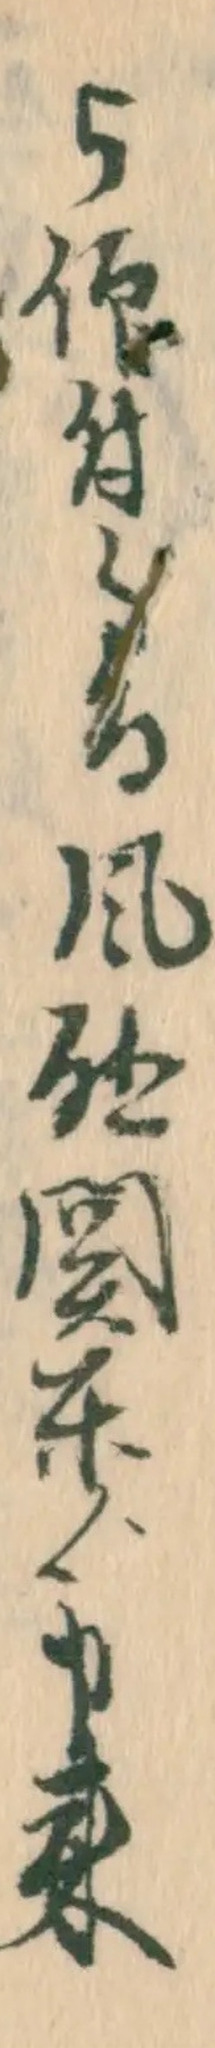被仰付候旨風聴関東ゟ申来
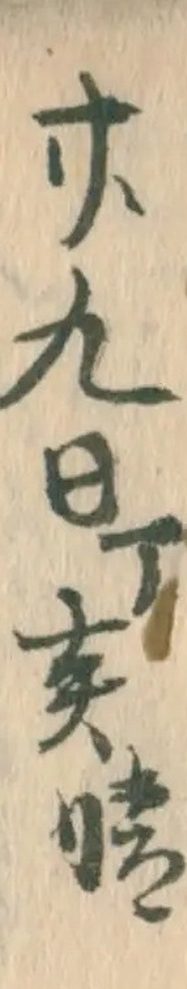廿九日丁亥晴
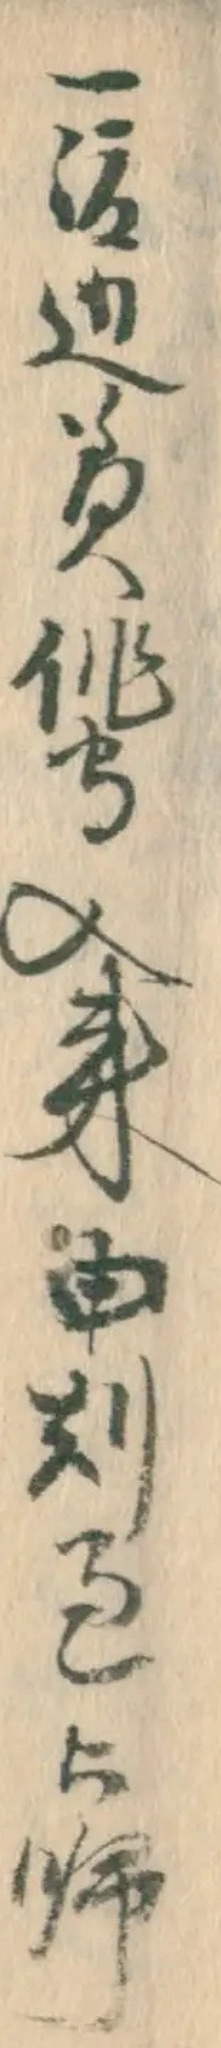一渡辺美作守入来申刻過被帰

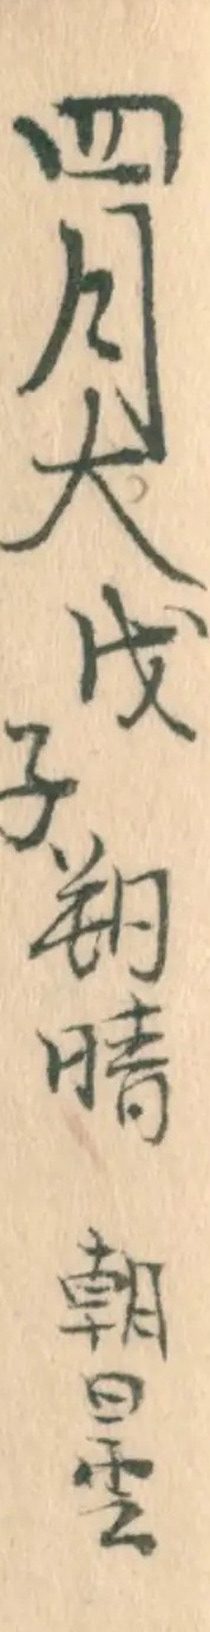四月大戊子朔晴朝曇
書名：禁裏御所御用日記. [131]
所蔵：国立国会図書館 National Diet Library, JAPAN
